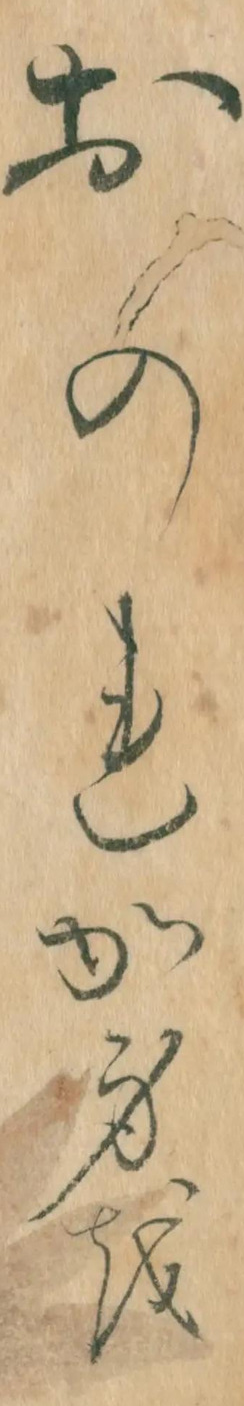おのれか身を
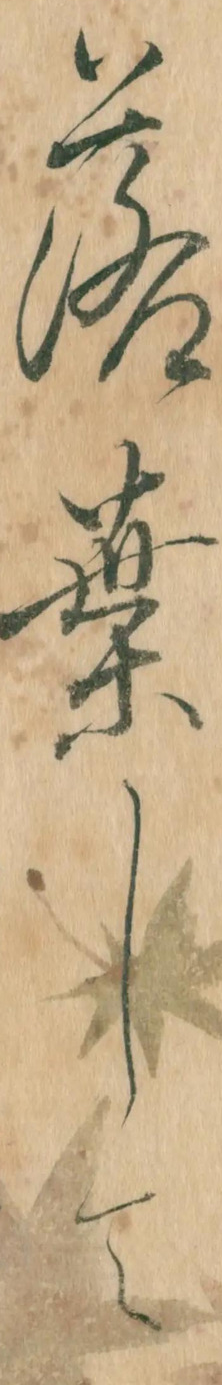落葉して
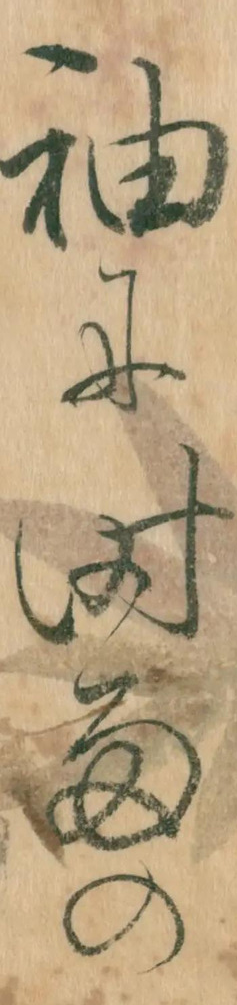袖に時雨の
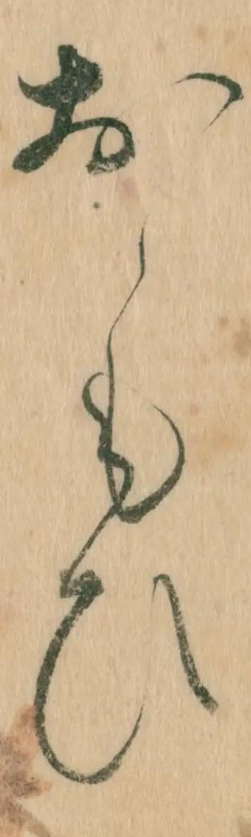おもひ
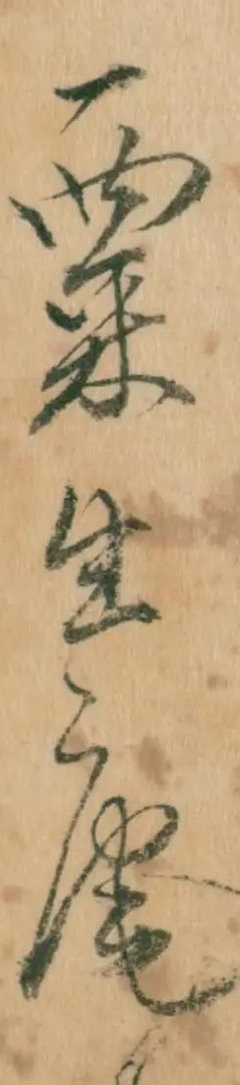粟生庵
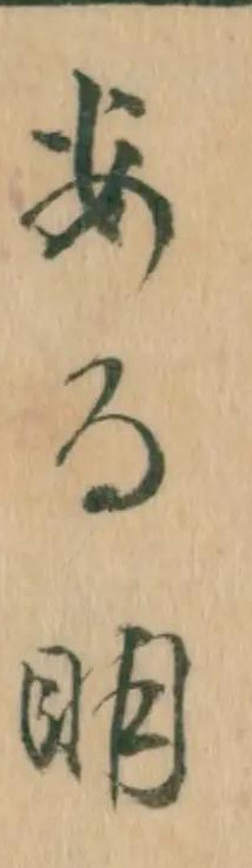ある眀
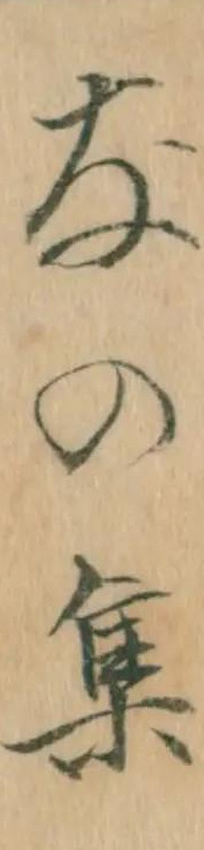友の集
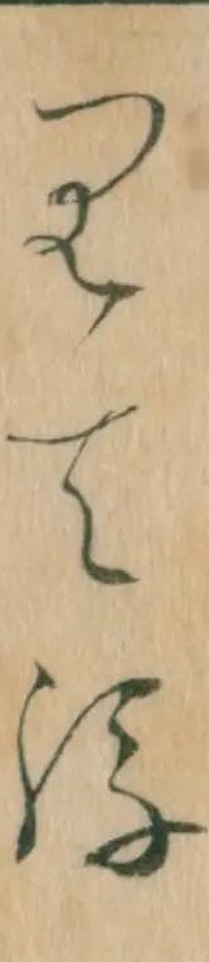りて後
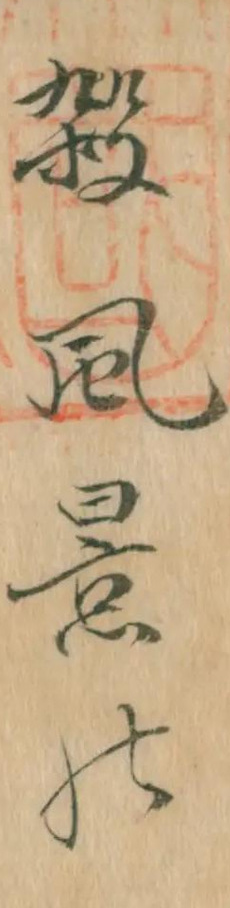殺風景の
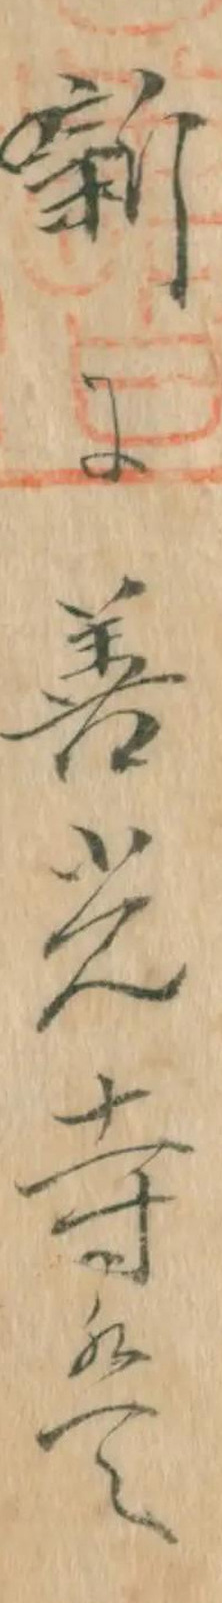噺に善光寺は
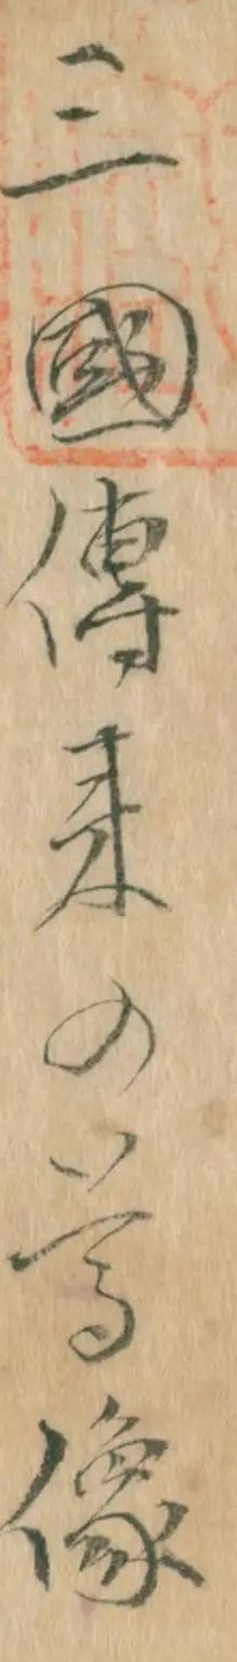三國傳来の尊像
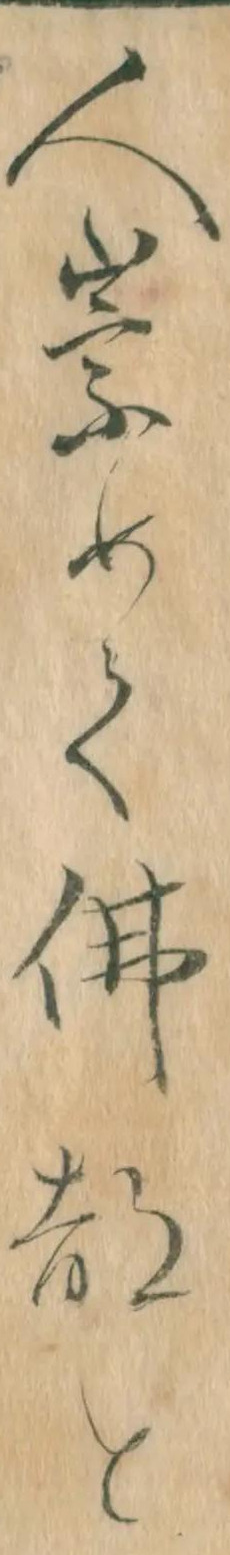人崇めて佛都と
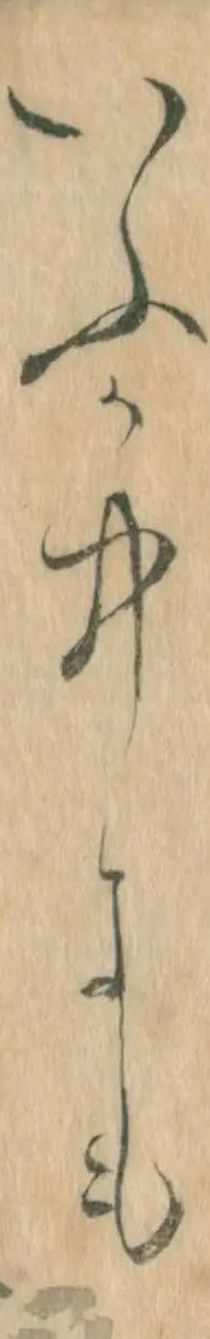いふか中にも
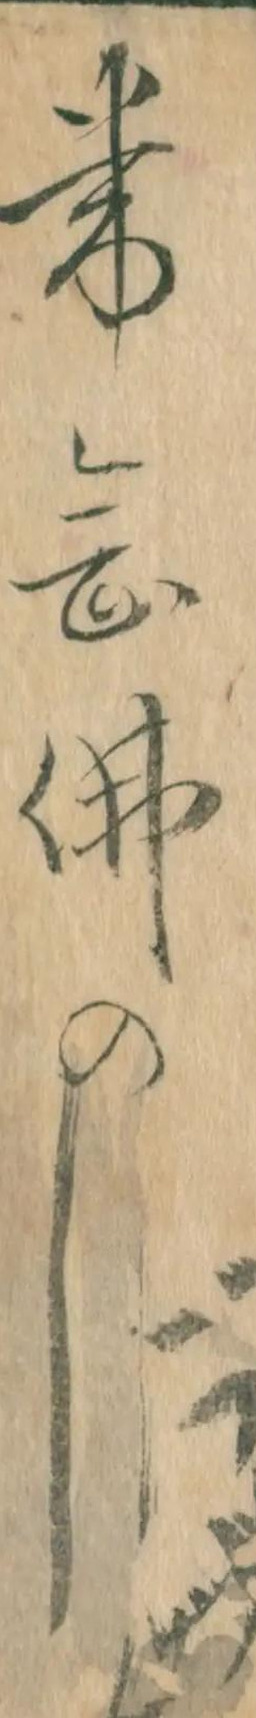常念佛の

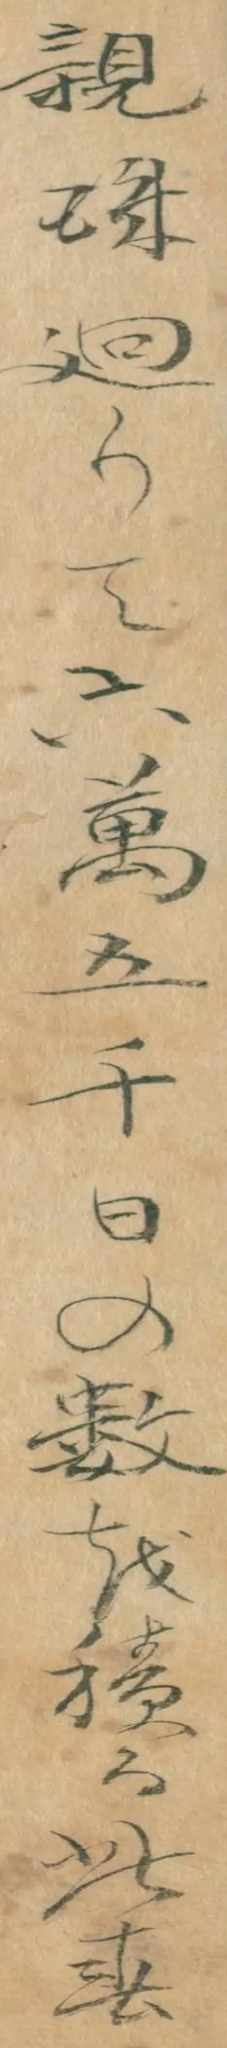親疎廻りて六萬五千日の數を積る此春
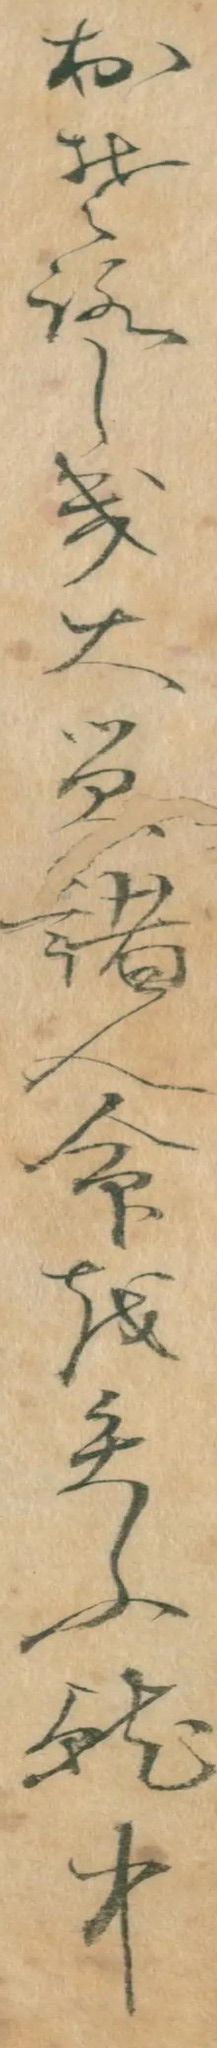おそろしき大災諸人命を失ふ就中
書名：俗語之種. [7]
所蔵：国立国会図書館 National Diet Library, JAPAN
